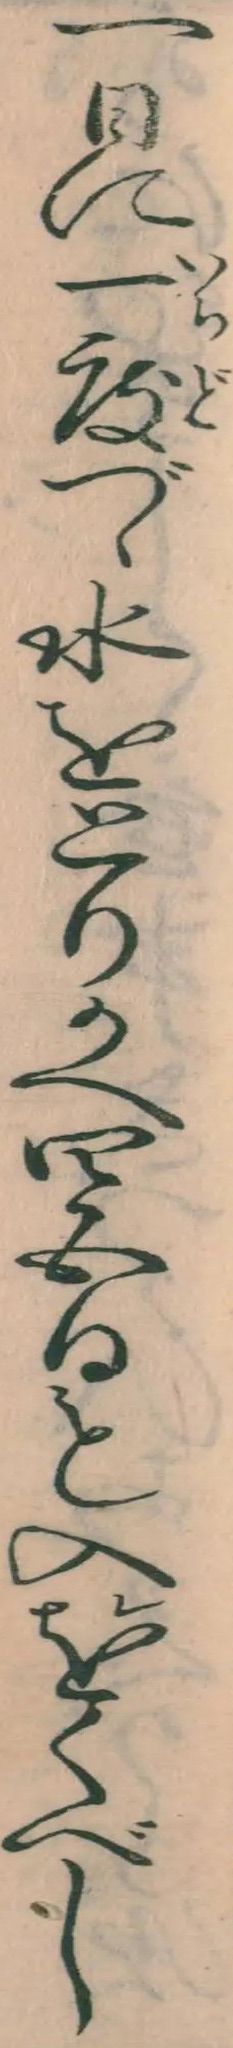一日に一度づゝ水をとりかへ四五日も入れをくべし
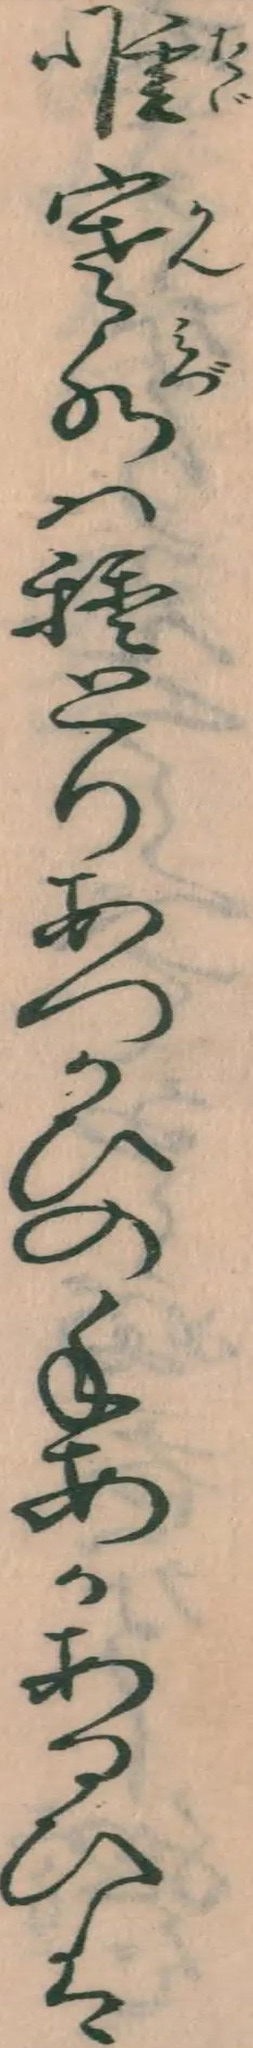唯寒水は種とりあつかひの手あかあるひは
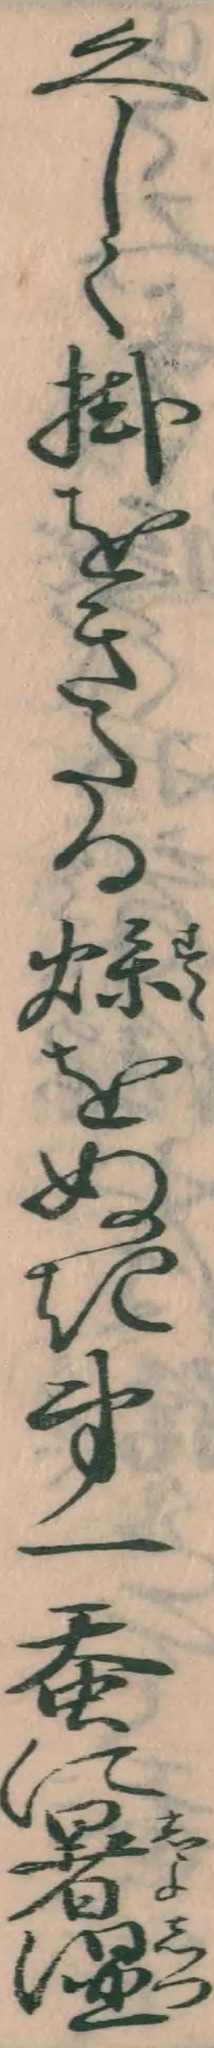久しく掛をきたる煤をぬき第一蚕に暑湿
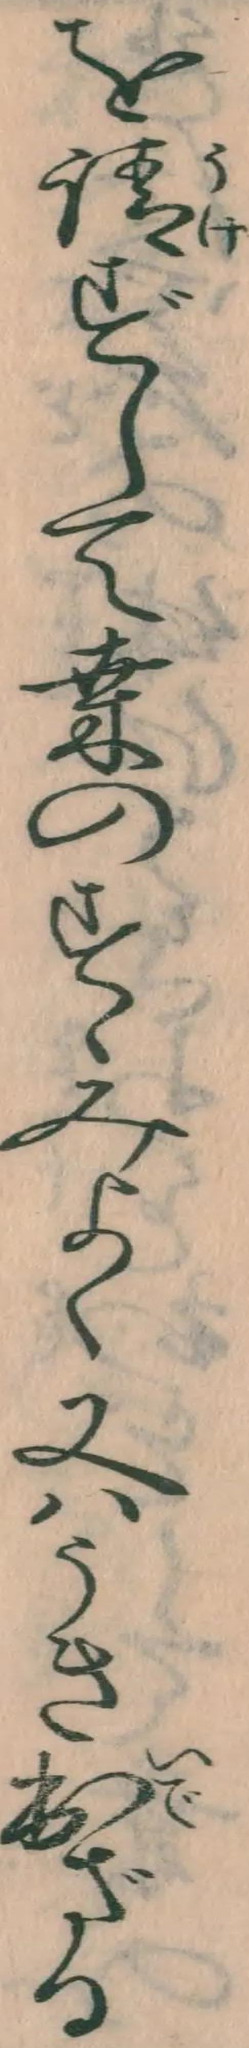を請ずして桑のすゝみよく又はうき出ざる
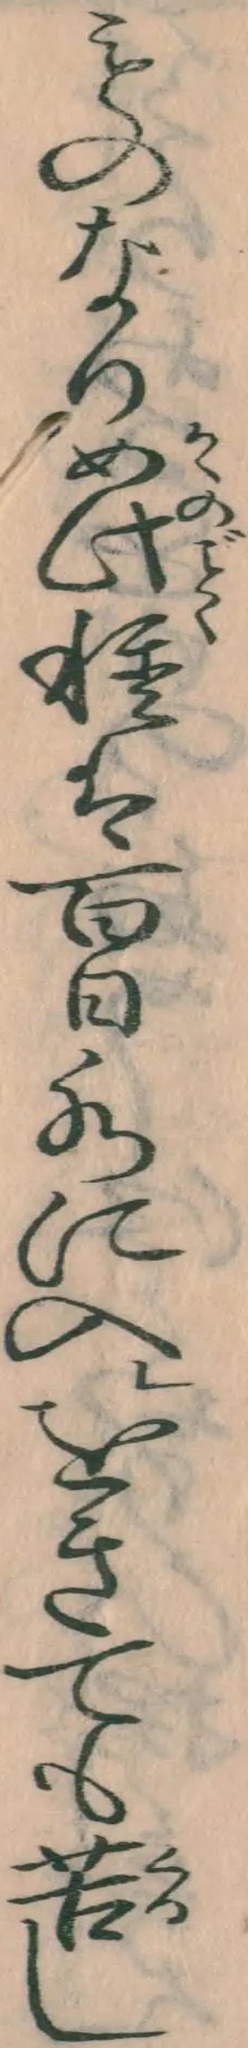ものなり如此種は百日水に入れをきても苦し
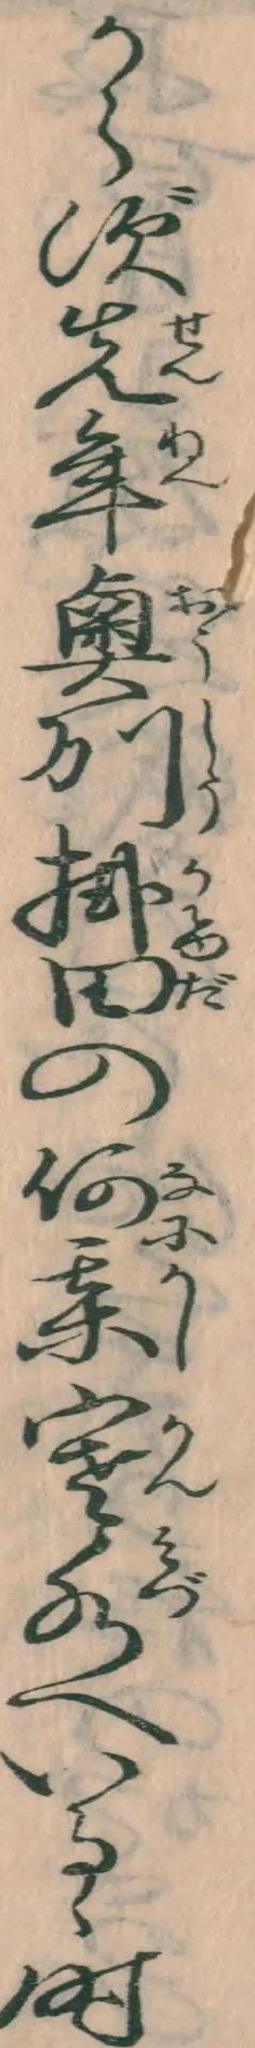からず先年奥州掛田の何某寒水へいるゝ時
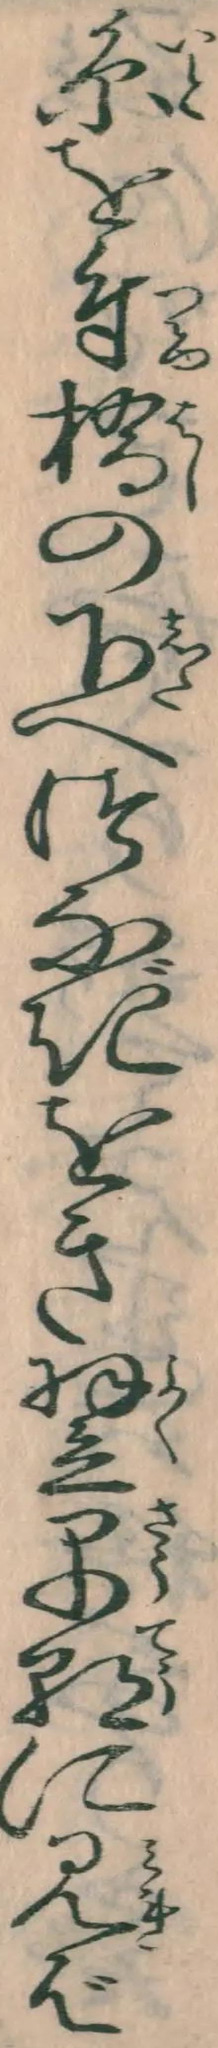糸を付橋の下へつなぎをき翌早朝に見ば
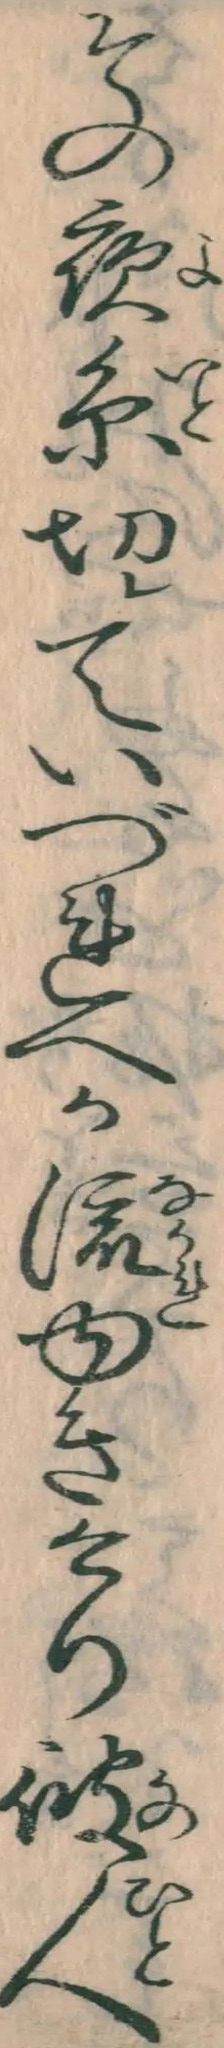その夜糸切れていづれへか流ゆきけり彼人
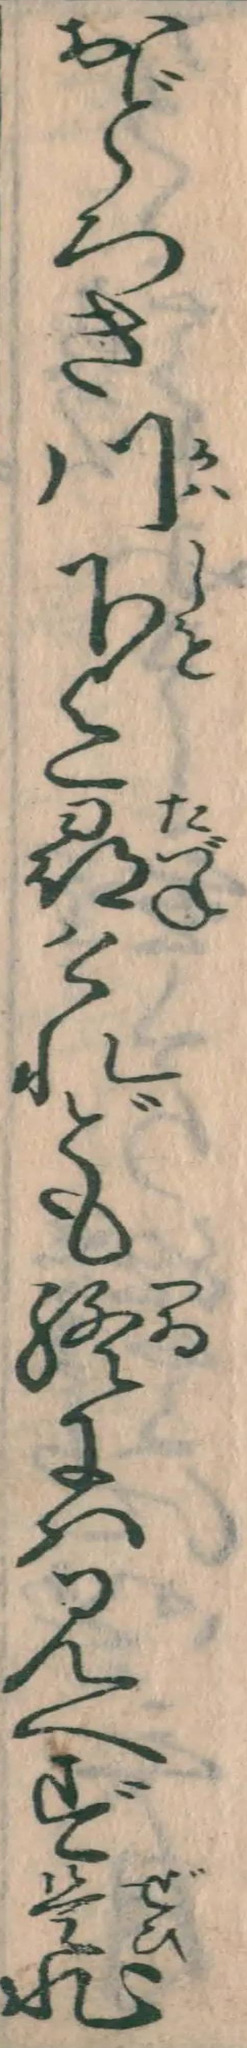おどろき川下迄尋けれども終には見へず是非

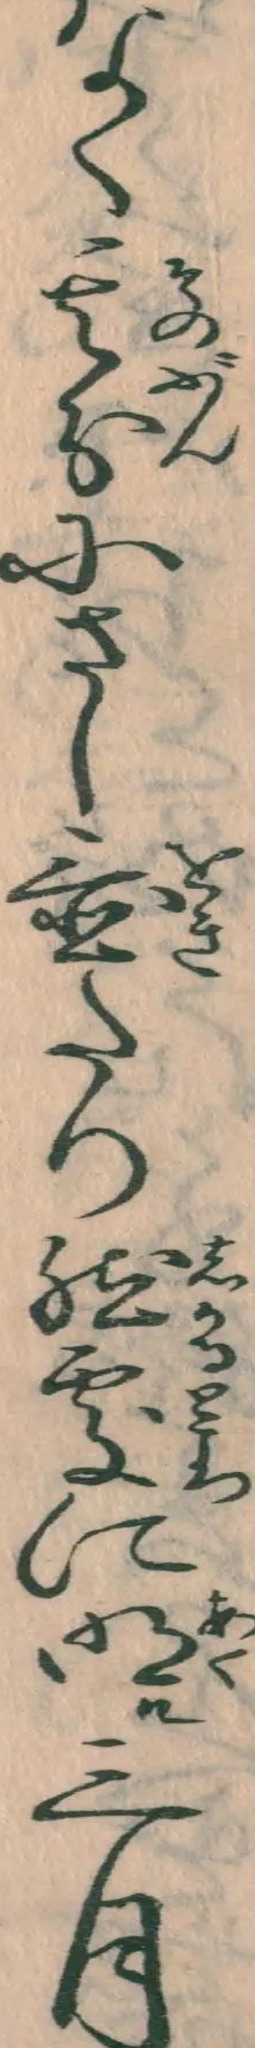なく其分にさし置たり然処に明る三月
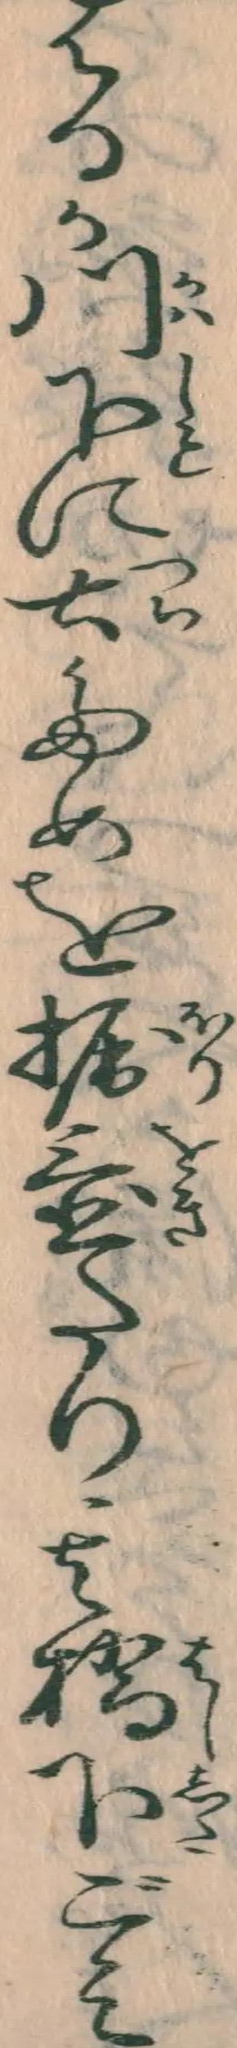はるか川下に土ためを振置たり其橋下ごみ
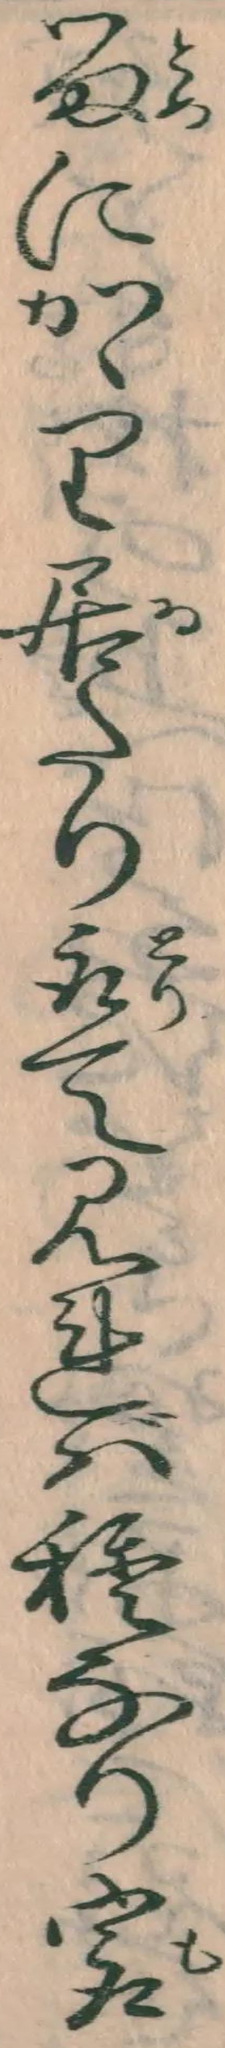留にかゝり居たり取て見れば種なり最
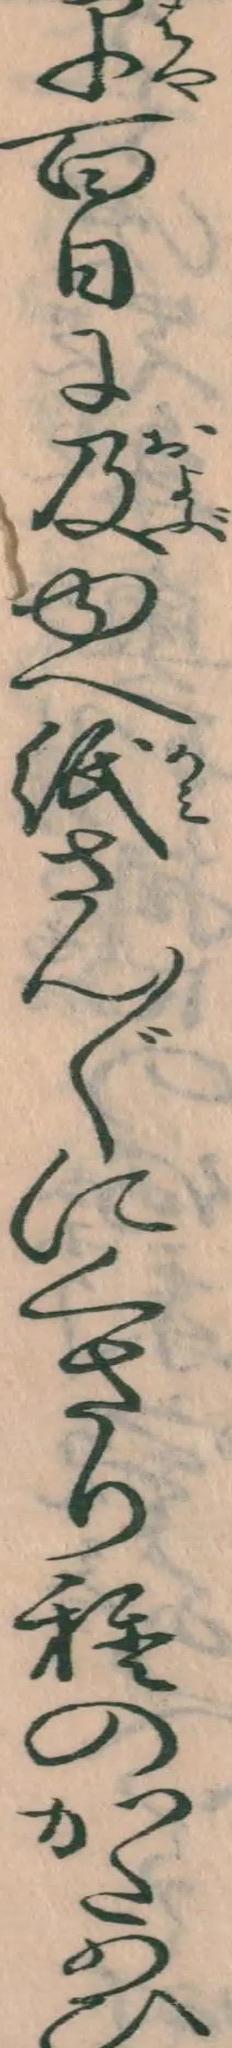早百日に及ゆへ紙さん〴〵にくさり種のかたかひ
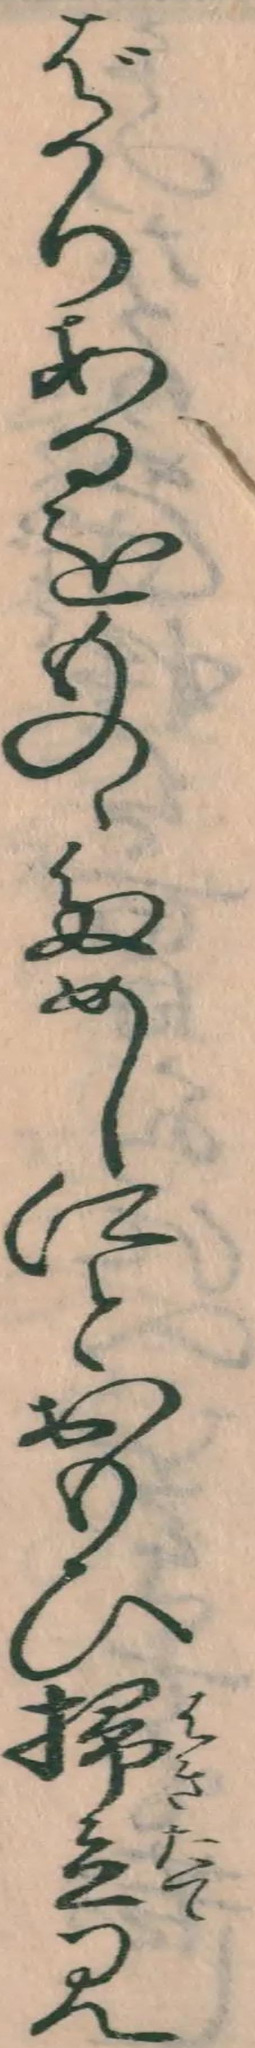ばかりあるをものゝためしにとおもひ掃立見
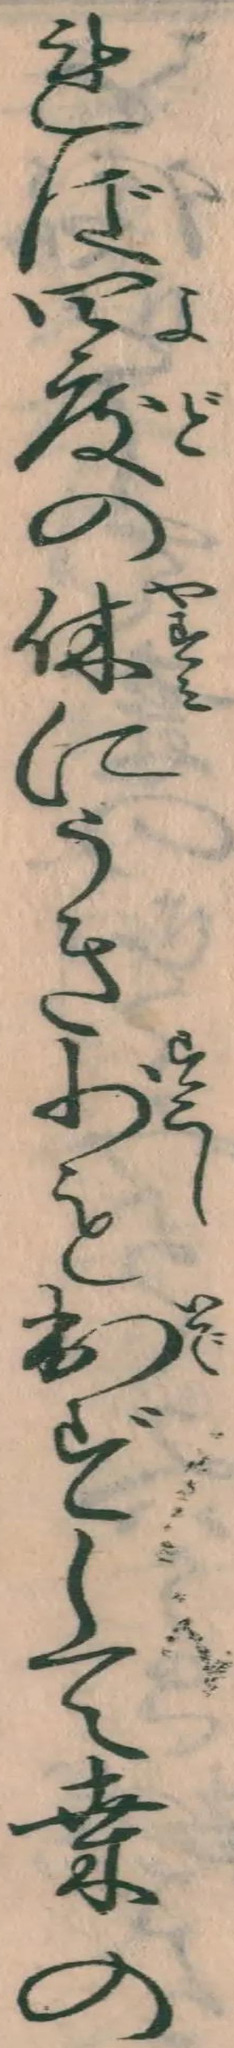れば四度の休にうき少も出ずして桑の
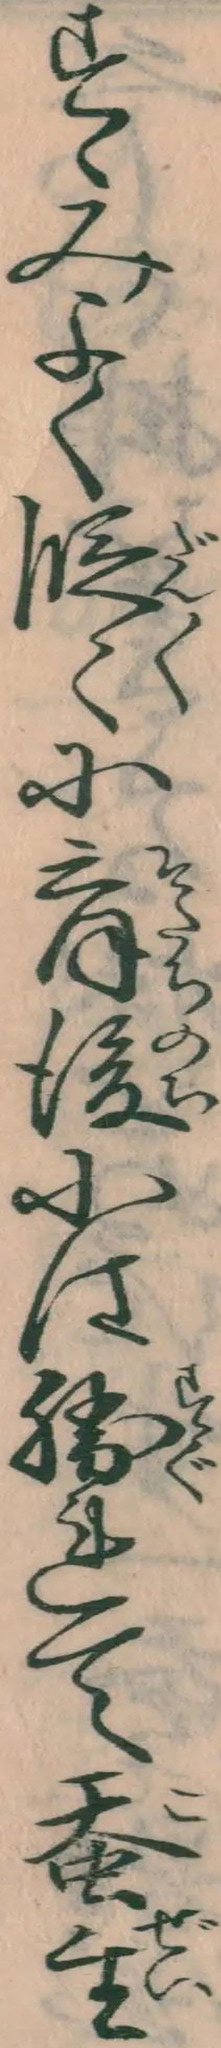すゝみよく段々に育後には勝れて蚕生
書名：新撰養蚕秘書
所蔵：国立国会図書館 National Diet Library, JAPAN
